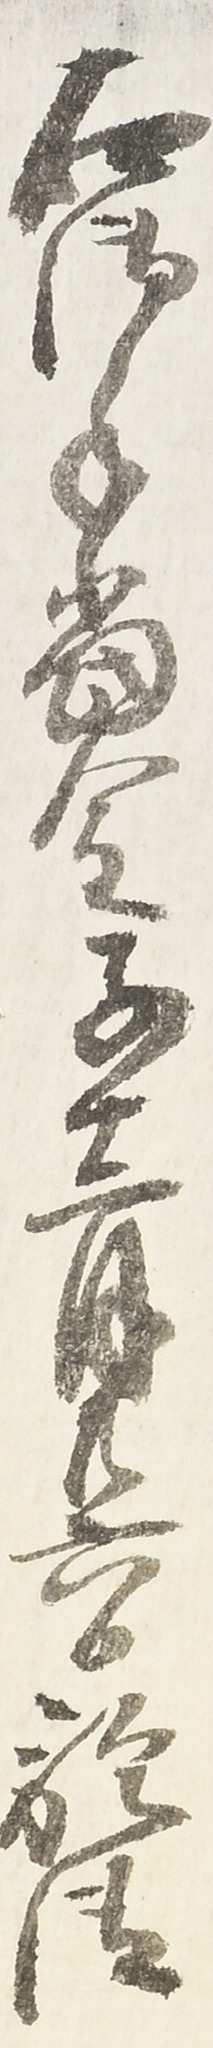右御手当金子十二月廿六日於御
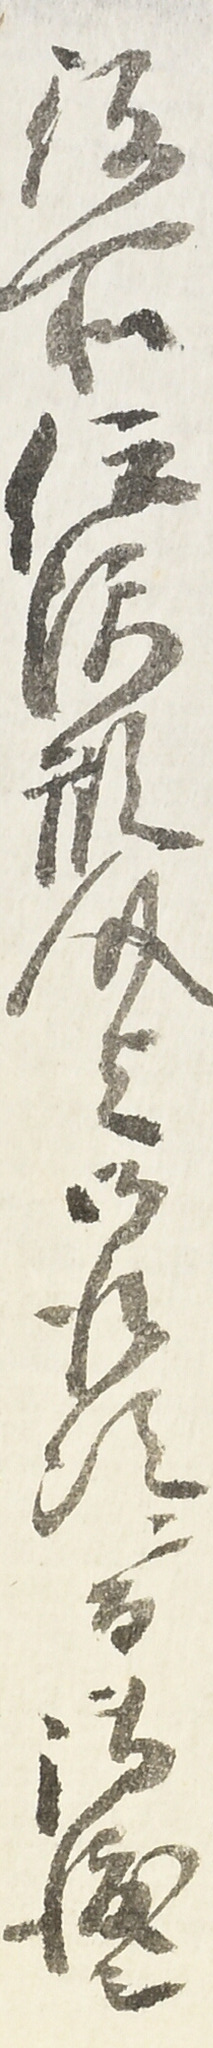役所伊沢形介殿御取次ニ而御渡し
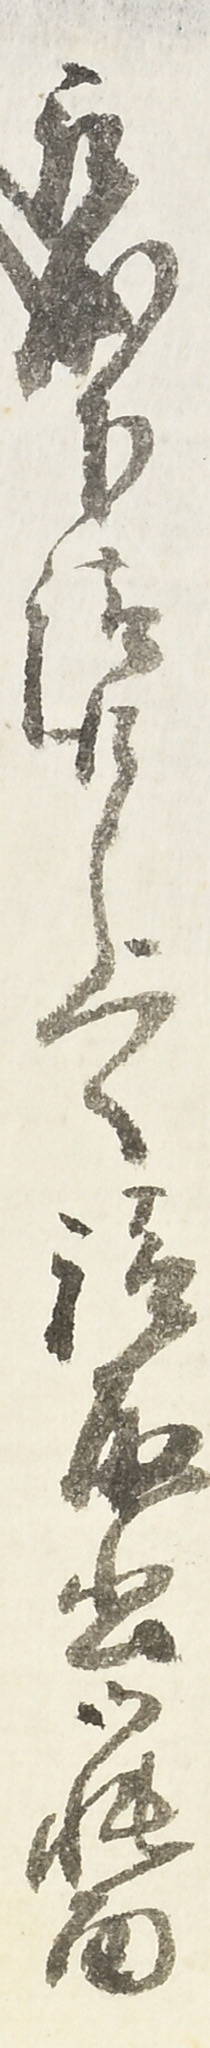被成下請取申上候請取書御帳面
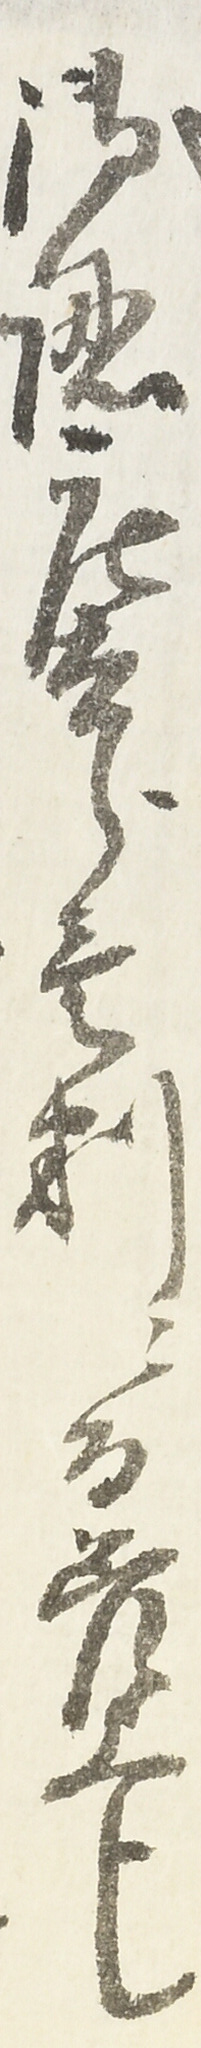御認庄吉郎壱判ニ而差上申し
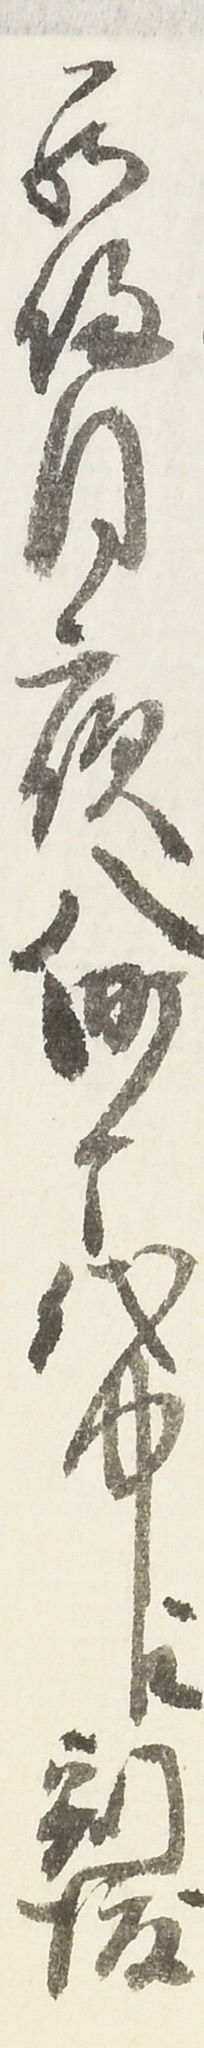罷帰同夜八町丁代中江割渡
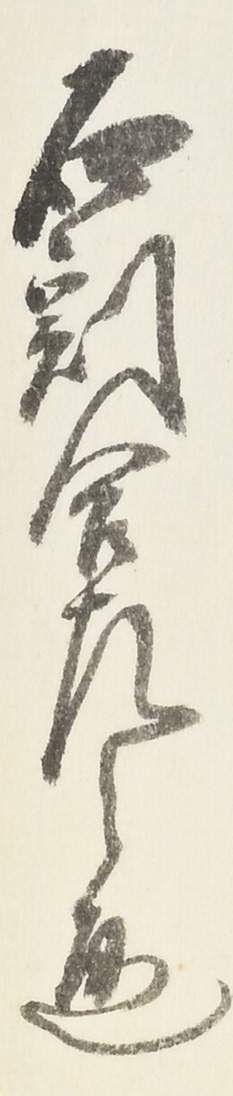右割合左之通

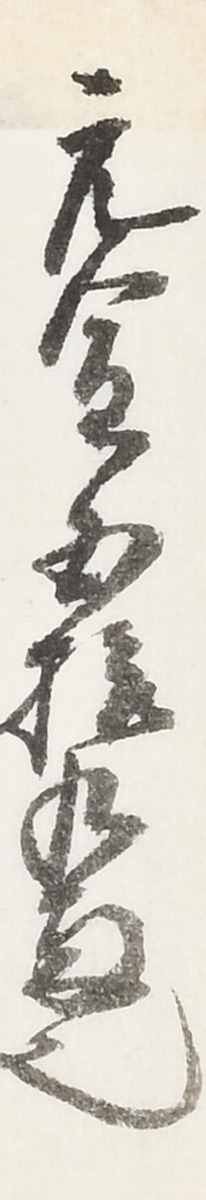元金五拾九両也
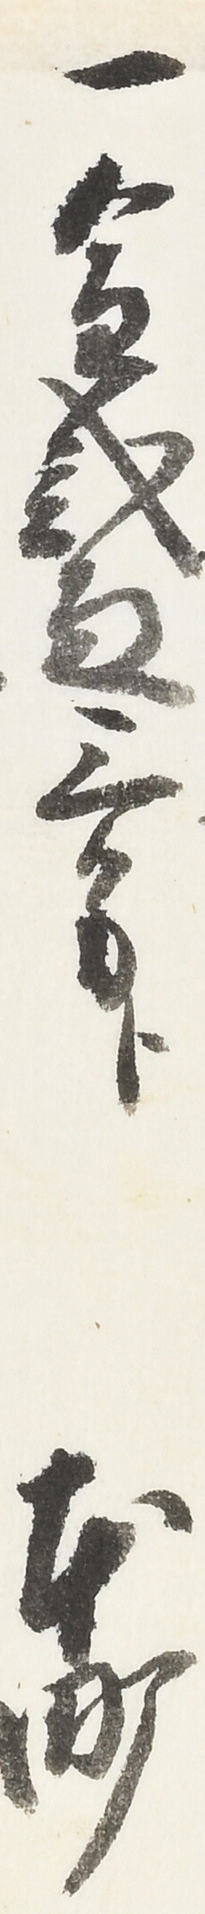一金弐両三分ト本町
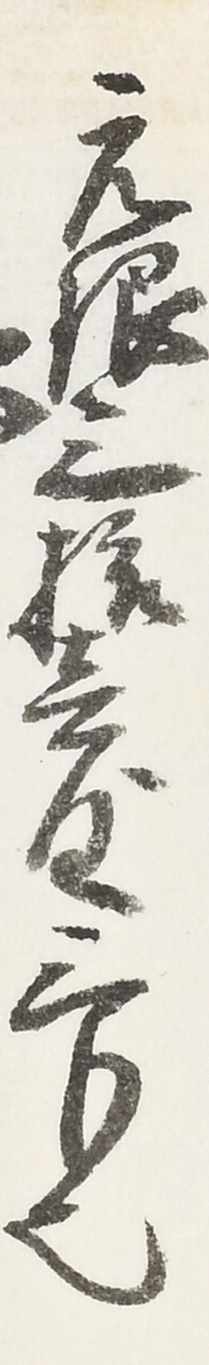元銀三拾壱匁三分也
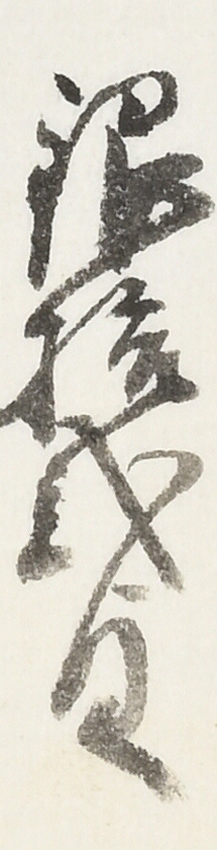銀拾弐匁
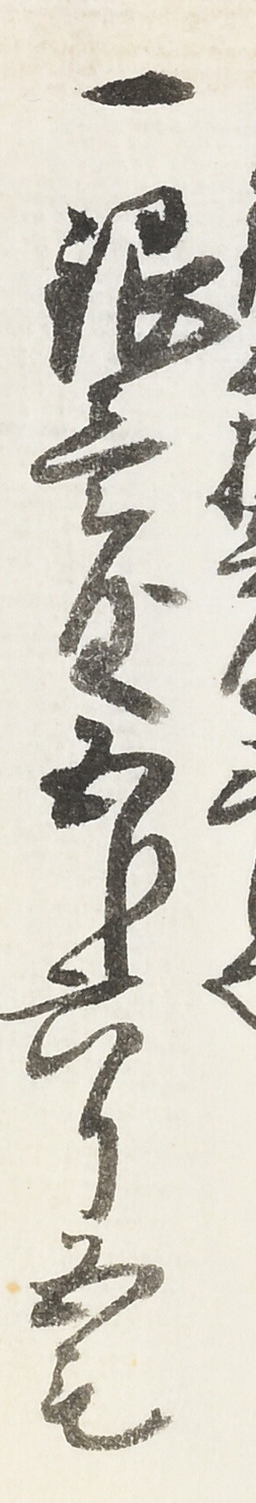一銀壱匁五分六厘五毛
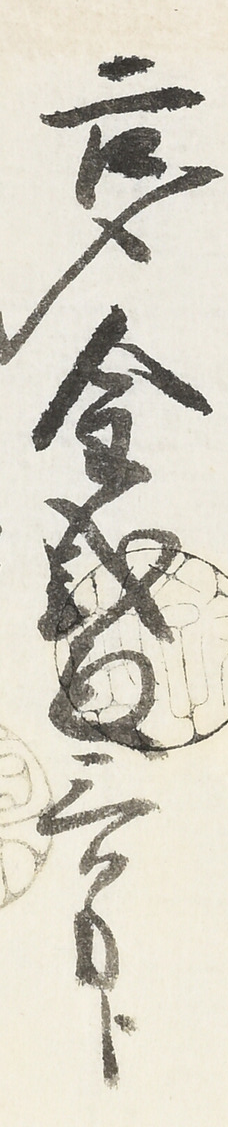二口〆金弐両三分ト
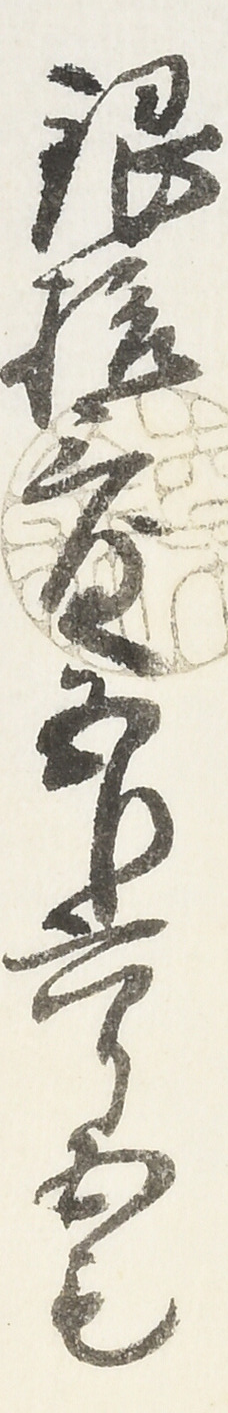銀拾三匁五分六厘五毛
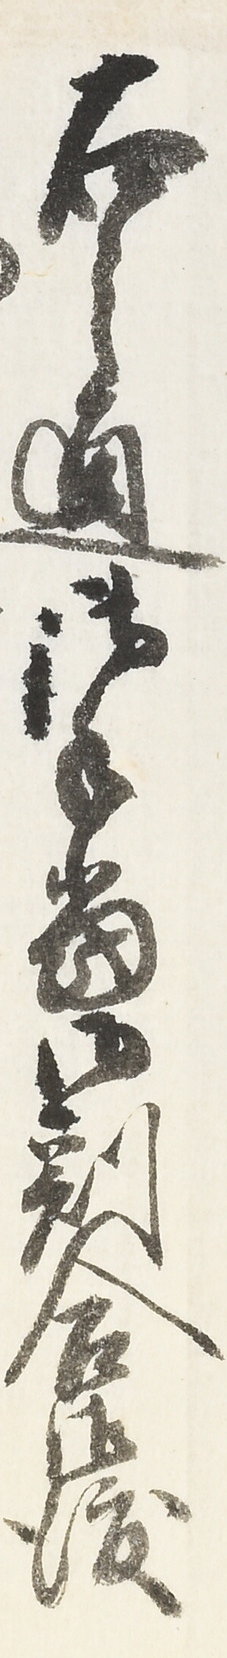右之通御手当御割合御渡
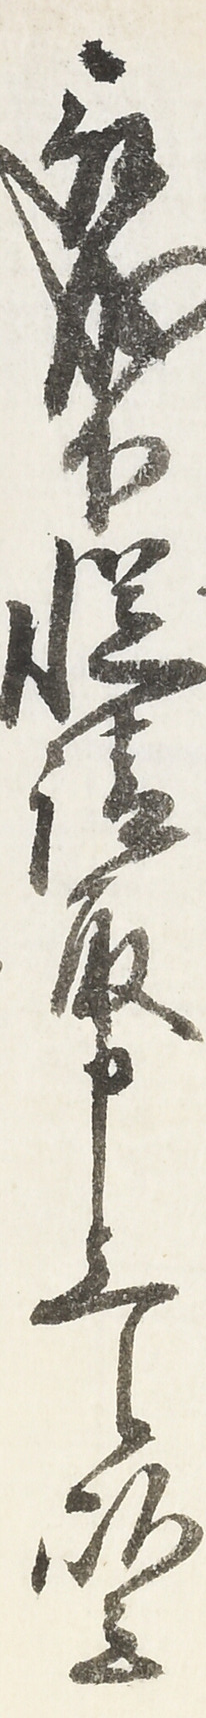被成下慥請取申上候以上
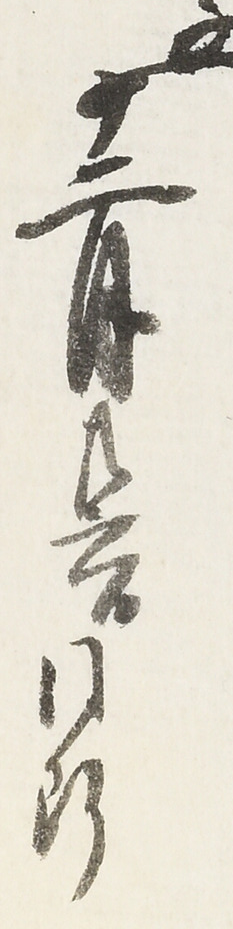十二月廿六日同断
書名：御才覚金御利足割渡扣帳
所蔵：伊那市立高遠町図書館・合同会社AMANE
